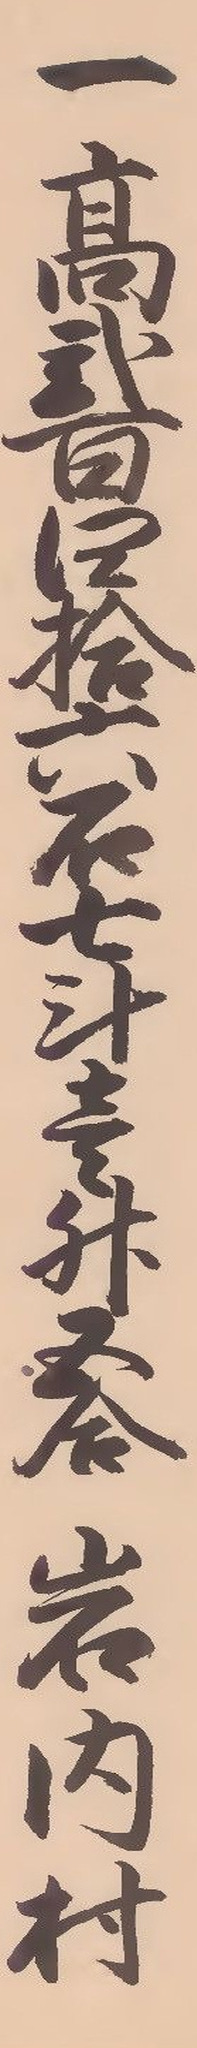一高弐百四拾六石七斗壱升五合岩内村

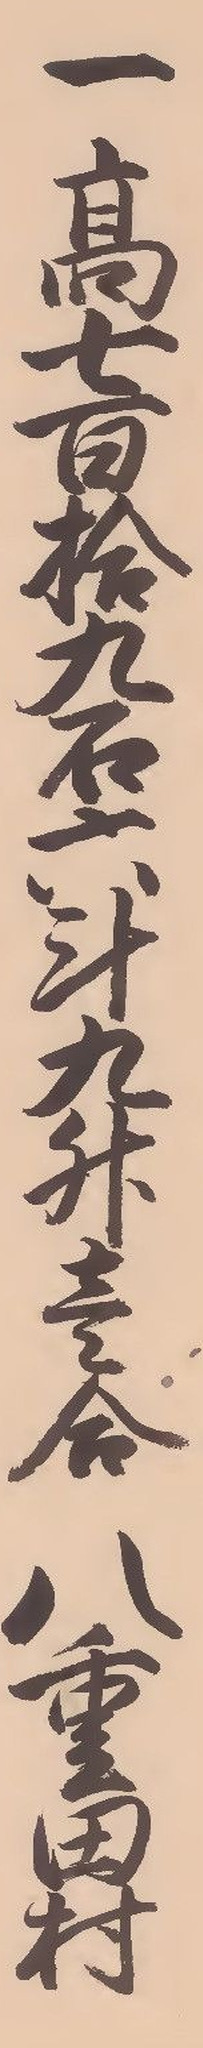一高七百拾九石六斗九升壱合八重田村
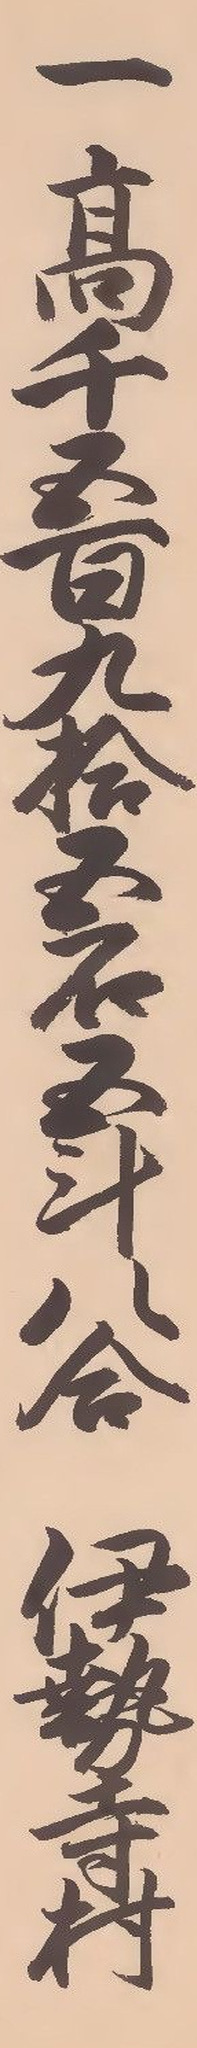一高千五百九拾五石五斗八合伊勢寺村
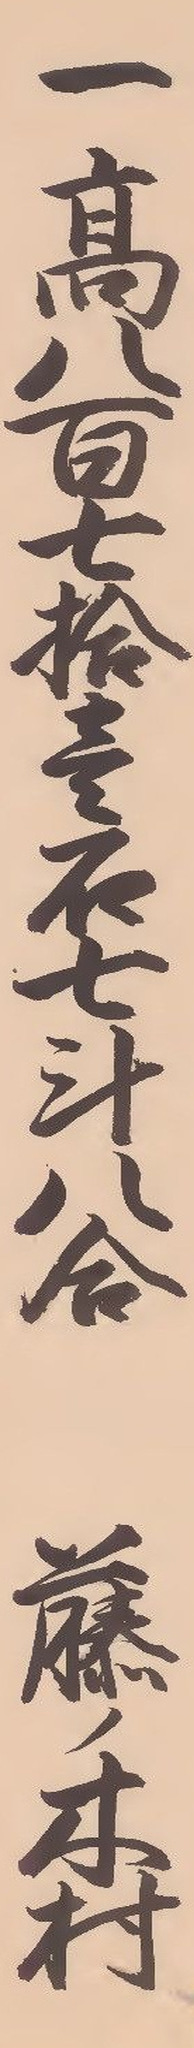一高八百七拾壱石七斗八合藤ノ木村
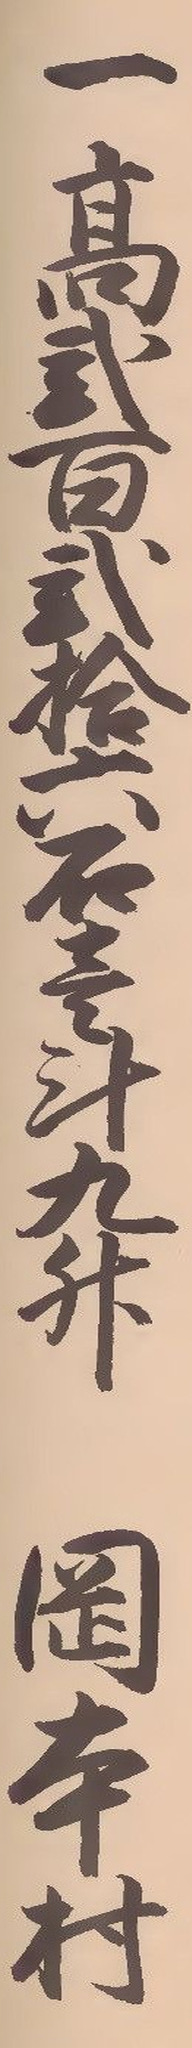一高弐百弐拾六石壱斗九升岡本村
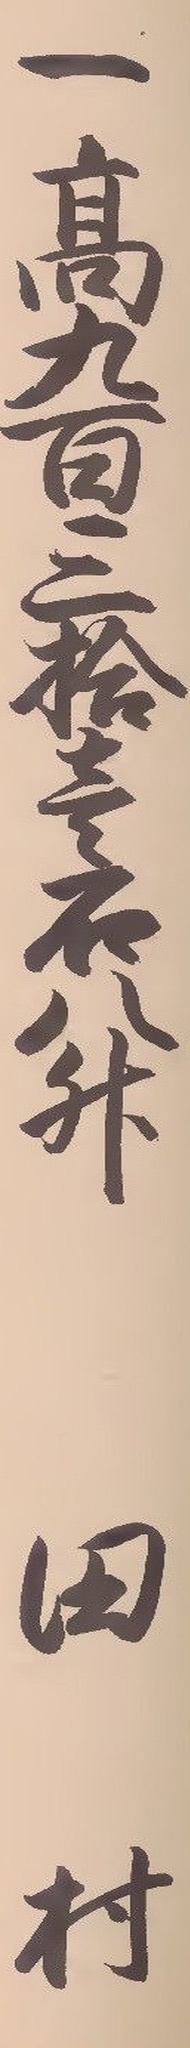一高九百三拾壱石八升田村
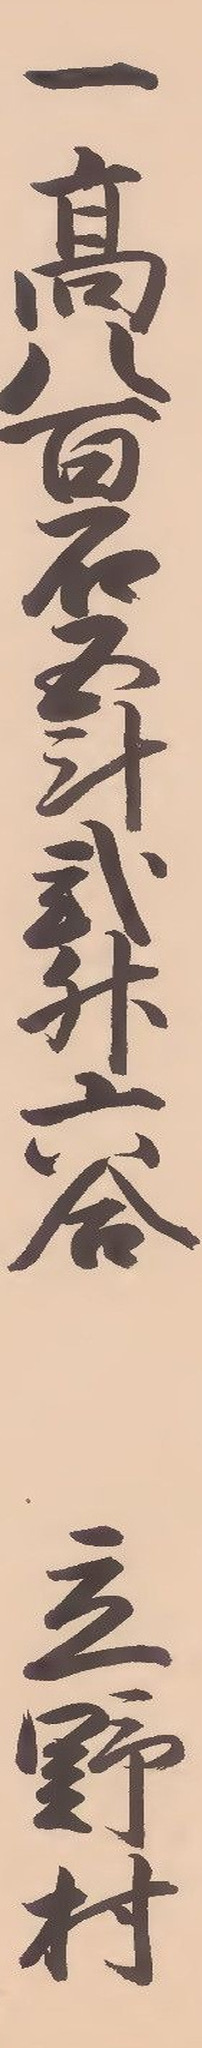一高八百石五斗弐升六合立野村
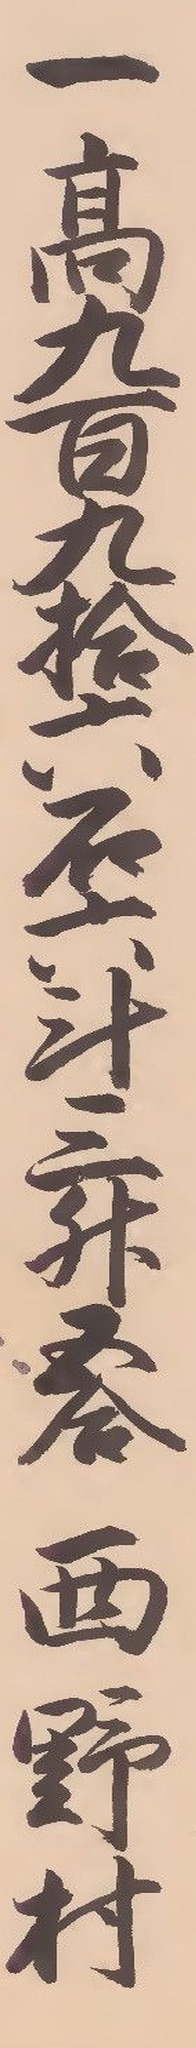一高九百九拾六石六斗三升五合西野村

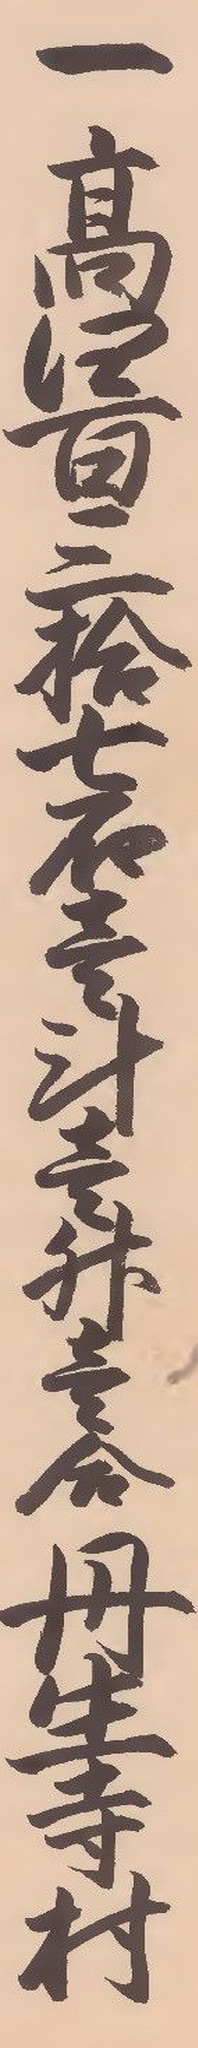一高四百三拾七石壱斗壱升壱合丹生寺村
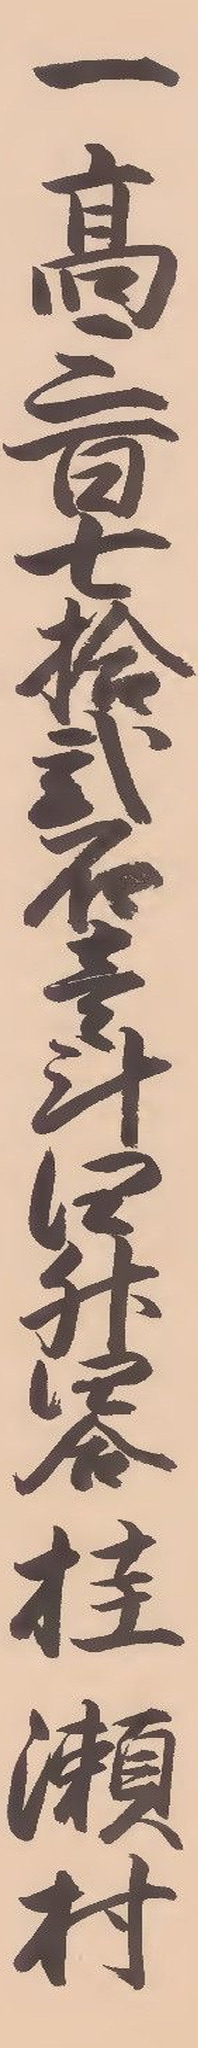一高三百七拾弐石壱斗四升四合桂瀬村
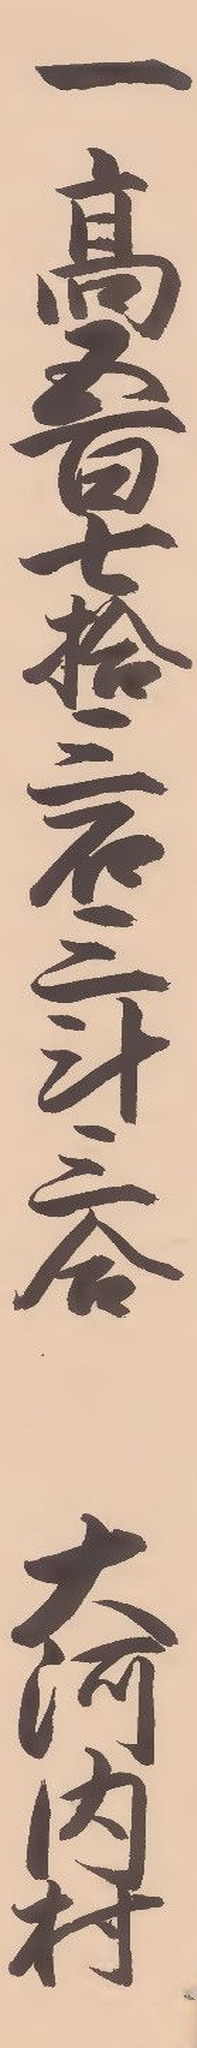一高五百七拾三石三斗三合大河内村
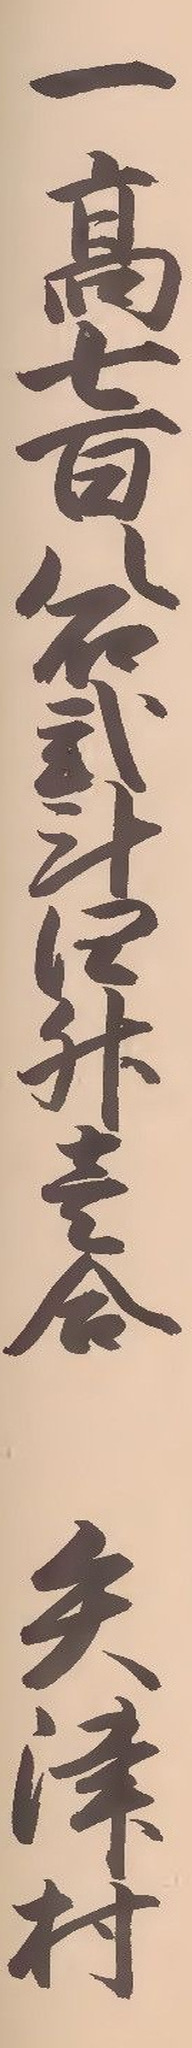一高七百八石弐斗四升壱合矢津村
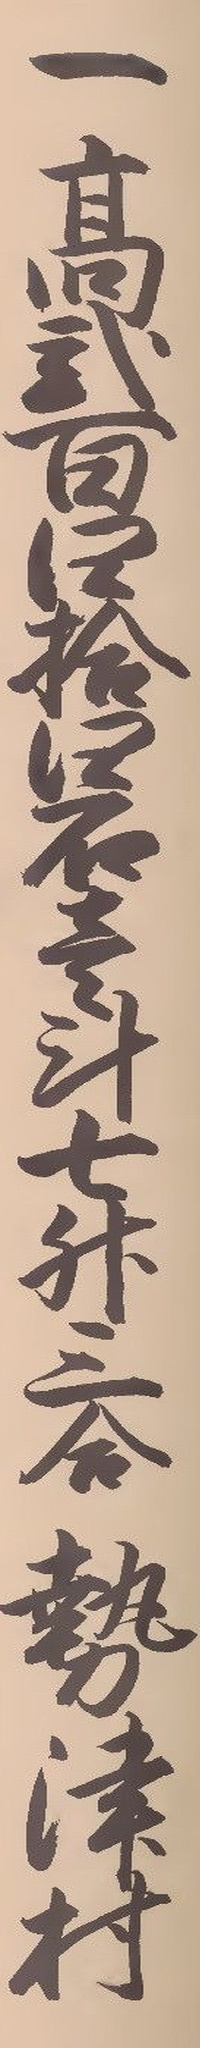一高弐百四拾四石壱斗七升三合勢津村
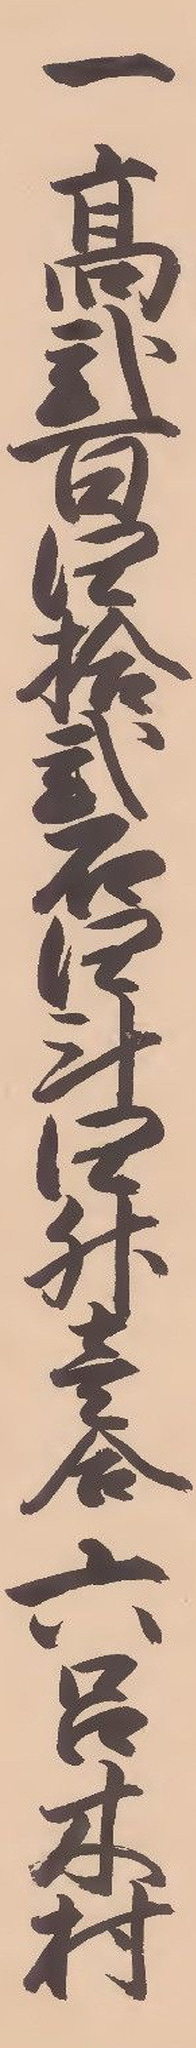一高弐百四拾弐石四斗四升壱合六呂木村
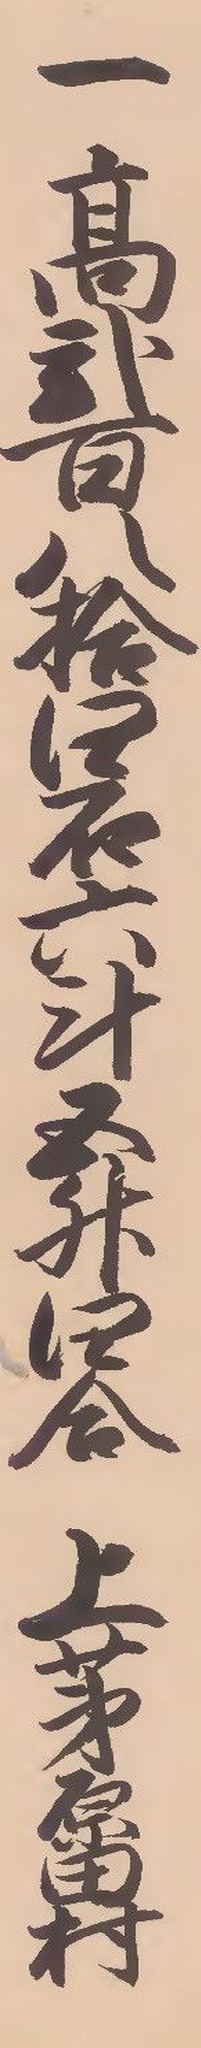一高弐百八拾四石六斗五升四合上茅原田村

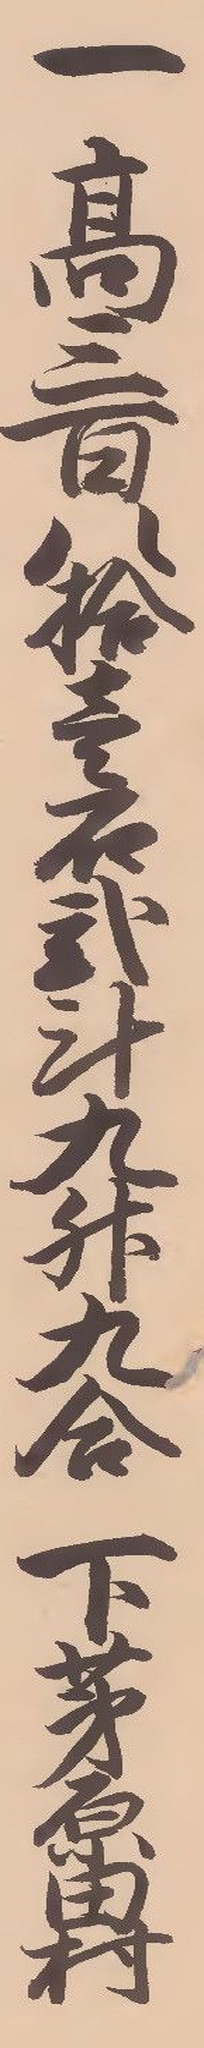一高三百八拾壱石弐斗九升九合下茅原田村
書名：伊勢国郷帳
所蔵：国立公文書館 National Archives of Japan
